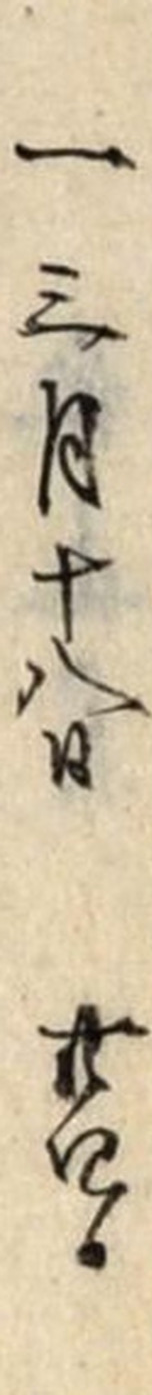一三月十八日廿四日
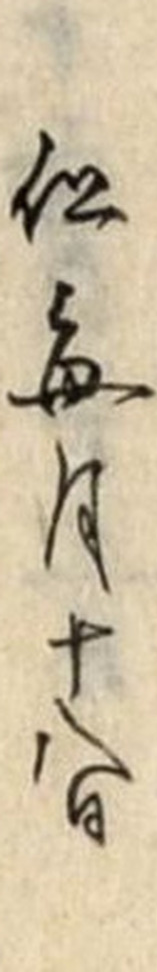但毎月十八日
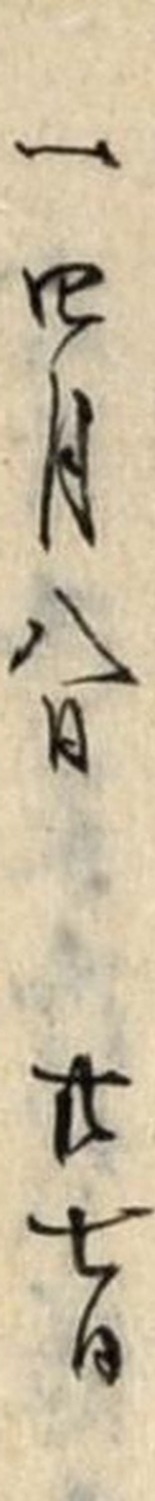一四月八日廿七日
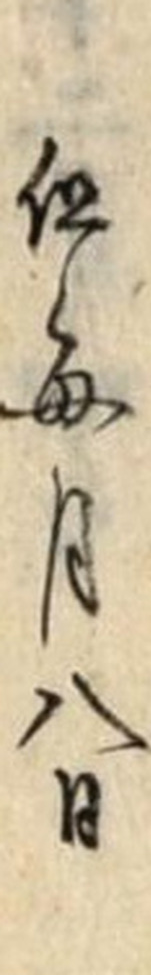但毎月八日
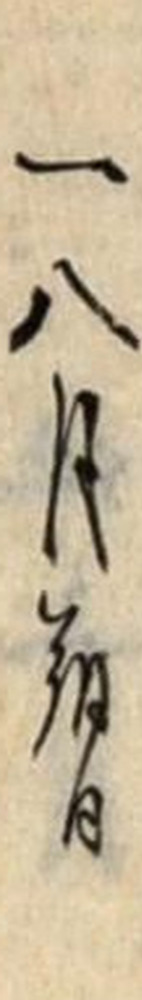一八月朔日
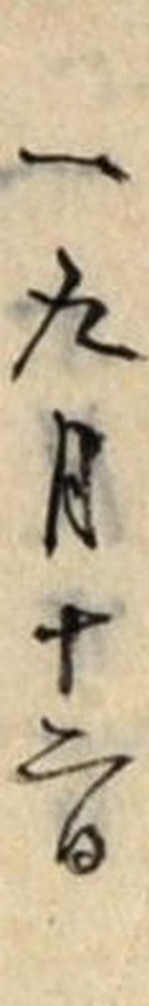一九月十二日

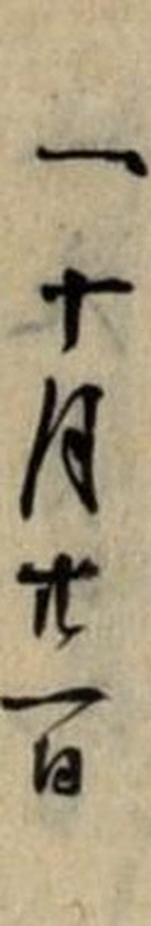一十月廿一日
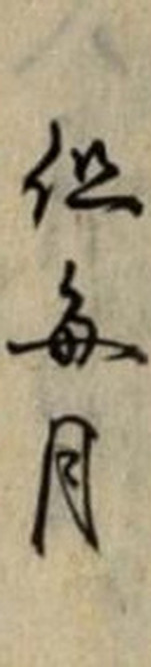但毎月
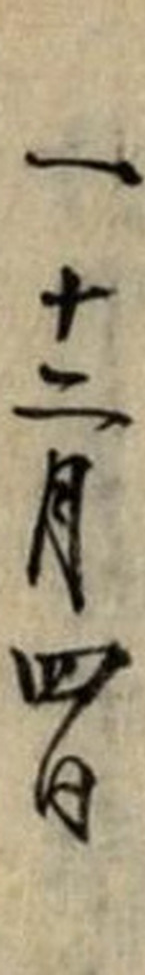一十二月四日
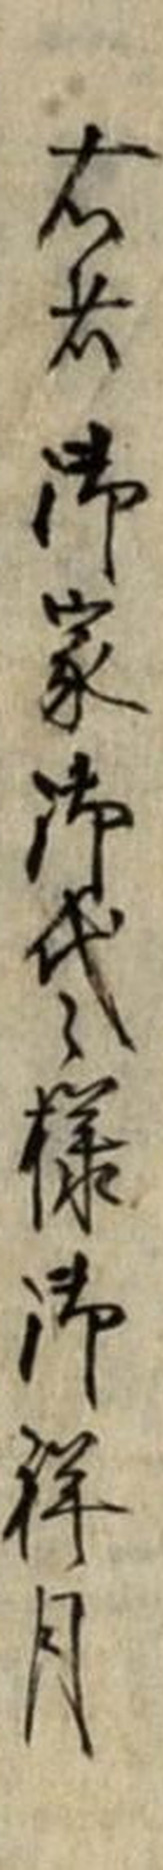右は御家御代々様御祥月
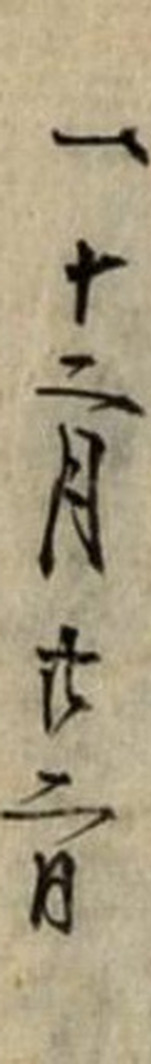一十二月廿二日
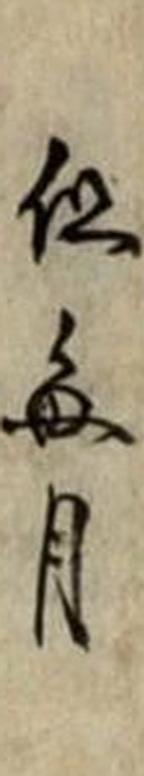但毎月
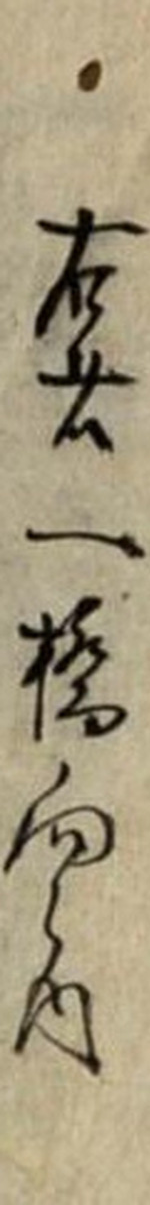右は一橋向之内
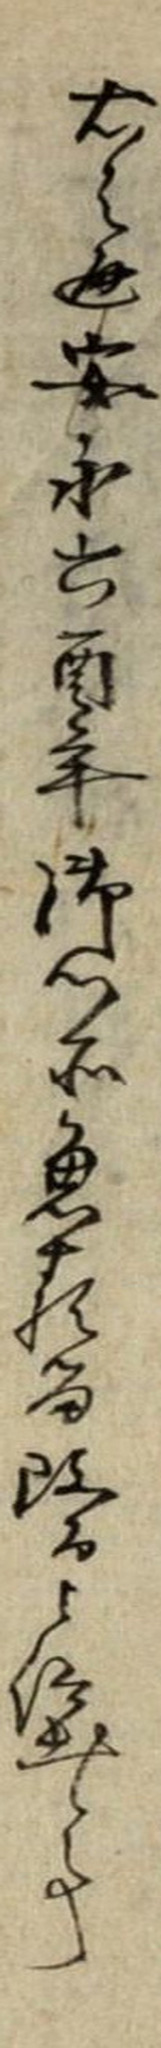右之通安永六酉年御門所魚類留改て被仰出候事

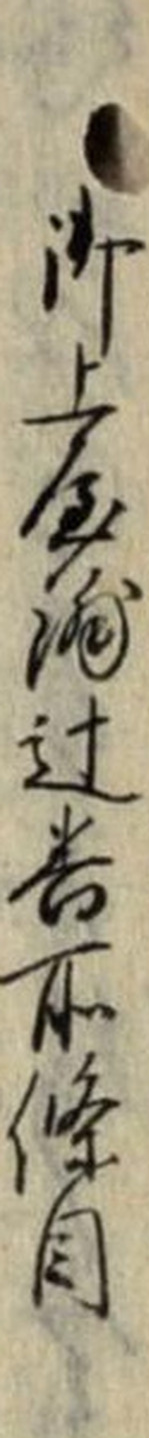御上屋鋪辻番所條目
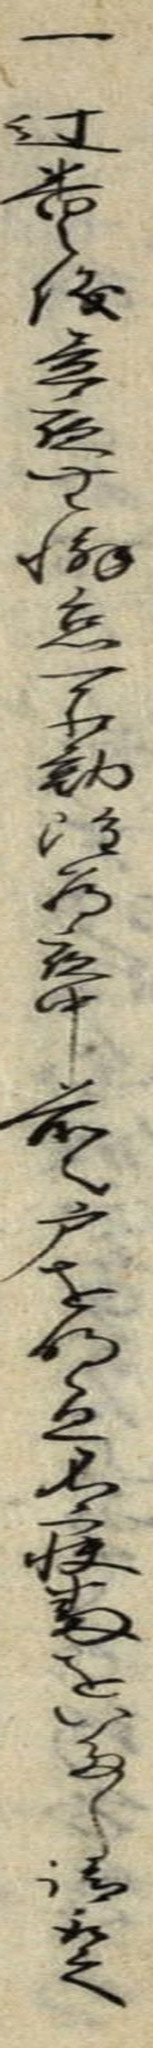一辻番之儀昼夜無懈怠可相勤雖為夜中前之戸を明立不寝番をいたし請取之
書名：三都并道中之部
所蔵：福井県文書館 Fukui Prefectural Archives
